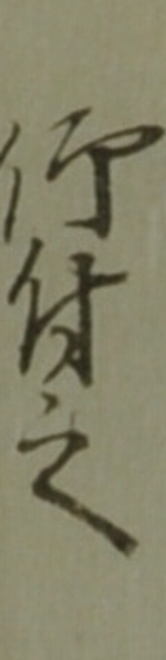仰付之
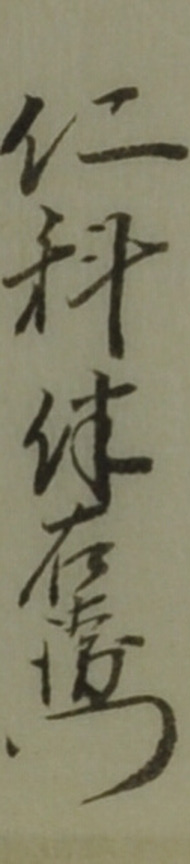仁科伴右衛門
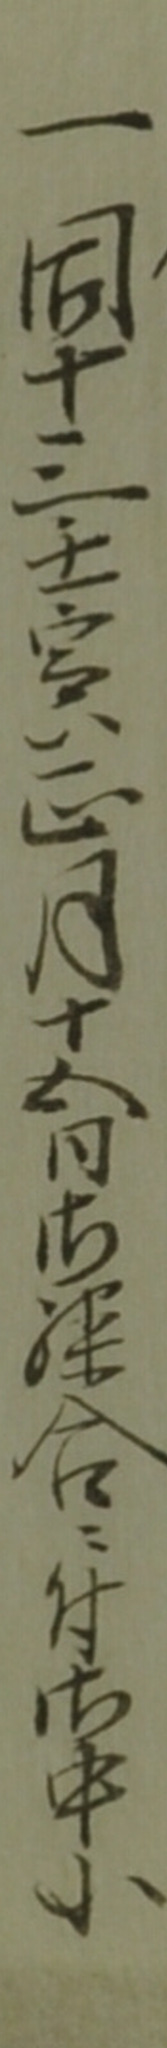一同十三壬寅正月十五日御繰合ニ付御中小
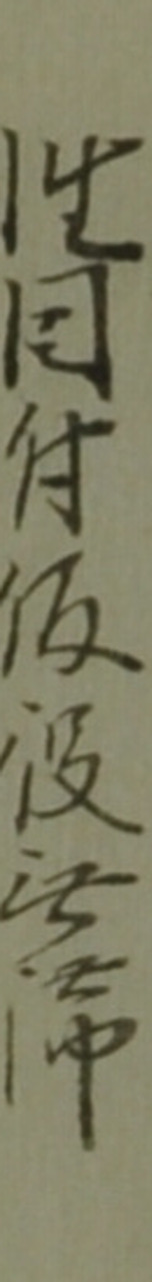姓目付仮役無滞

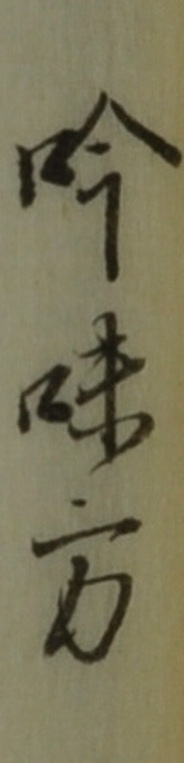吟味方
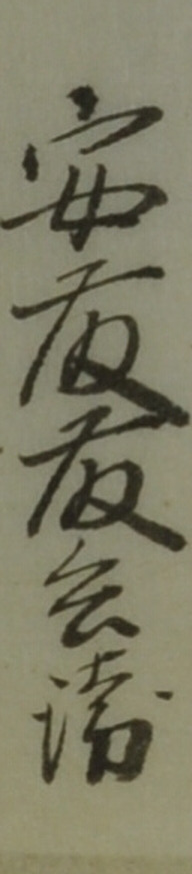安藤藤兵衛
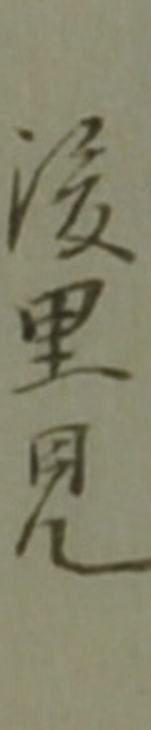後里見
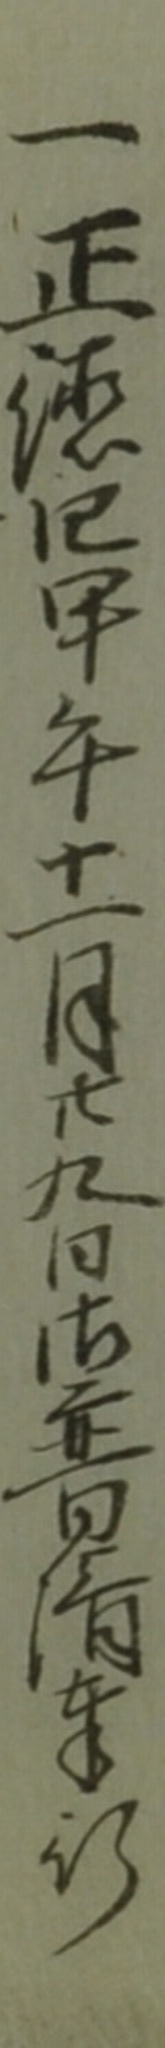一正徳四甲午十一月廿九日御普請奉行
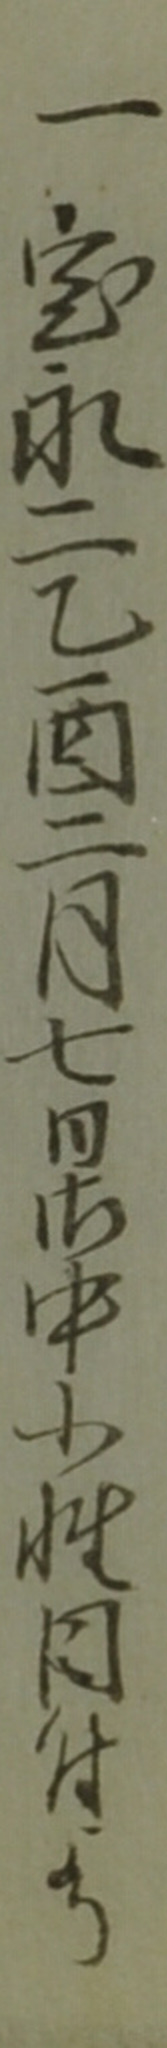一宝永二乙酉二月七日御中小姓目付より
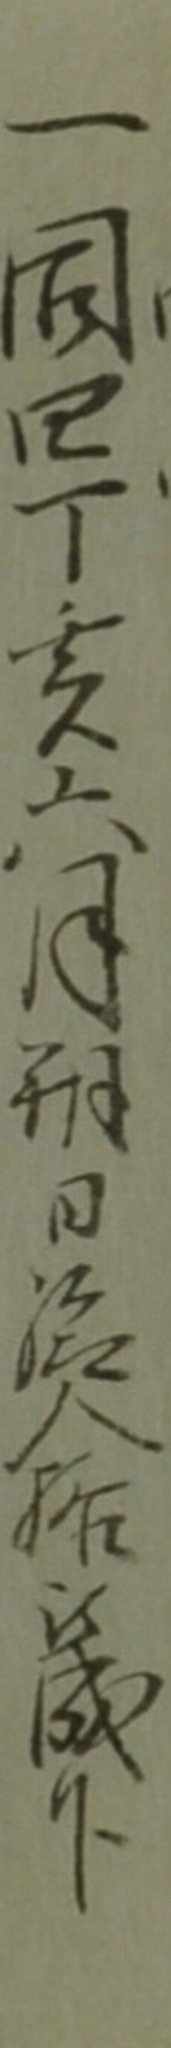一同四丁亥六月朔日給人格被成下
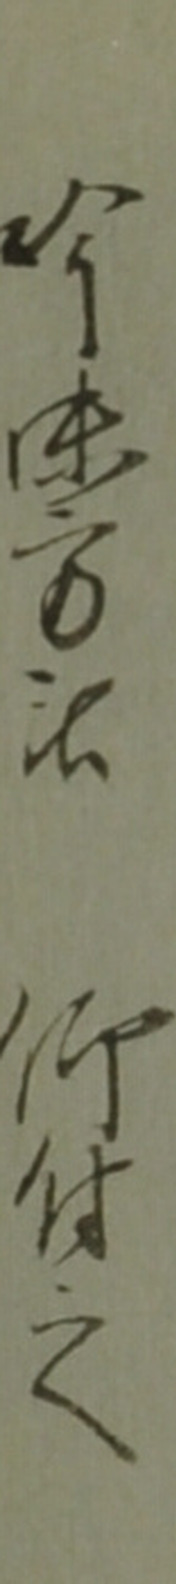吟味方被仰付之
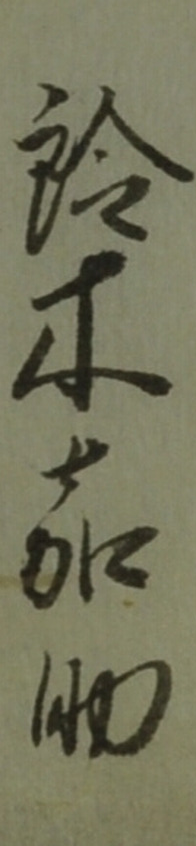鈴木嘉助
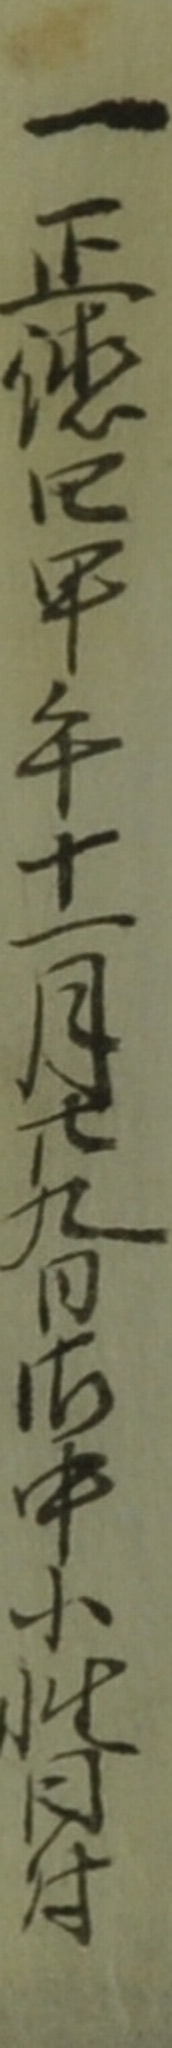一正徳四甲午十一月廿九日御中小姓目付
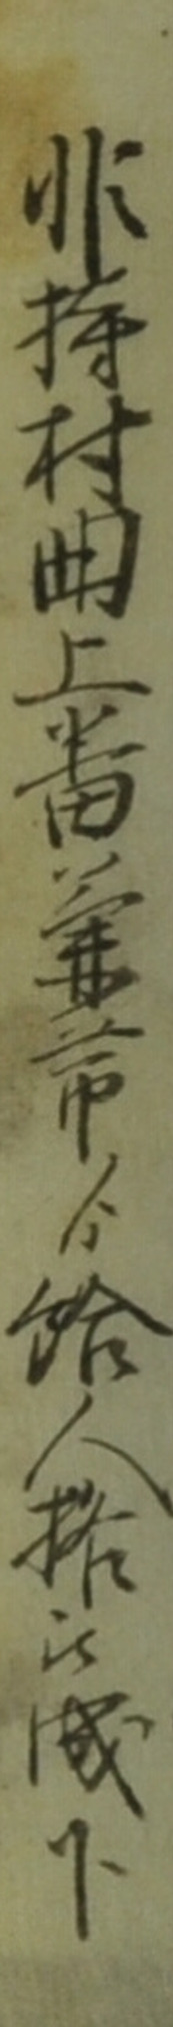非持村曲上番兼帯より給人格被成下
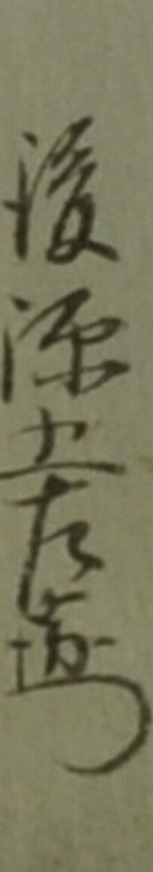後源五左衛門

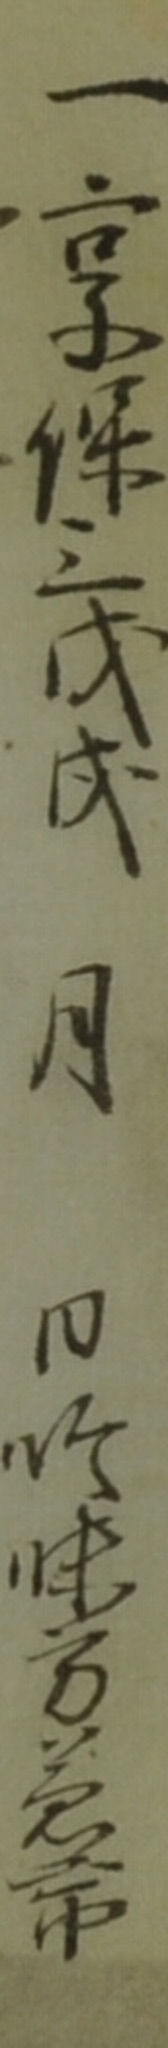一享保三戊戌月日吟味方兼帯
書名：諸御役代々録（八）
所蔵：伊那市立高遠町図書館・合同会社AMANE
